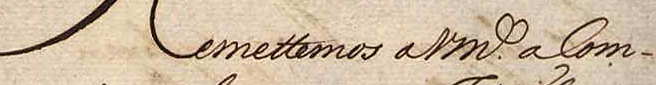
E Remettemos a Vm.e a Com
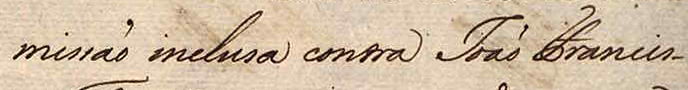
missaõ inclusa contra Joaõ Francis
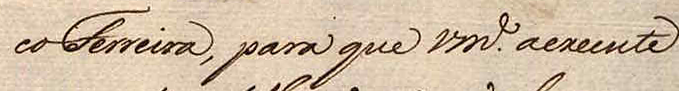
co Ferreira, para que v m.e a execute
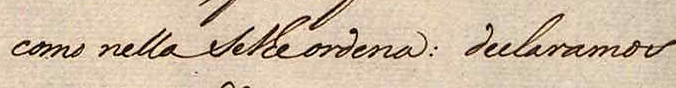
como nella Se lhe ordena: declaramos
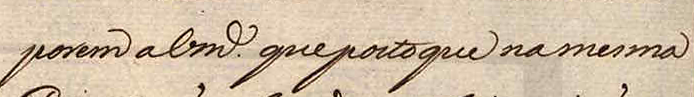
porem a vm.e que posto que na mesma
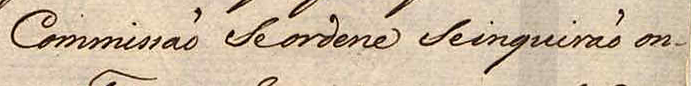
Commissaõ Se ordene se inquiraõ on
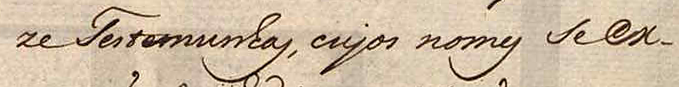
ze Testemunhas, cujos nomes se ex
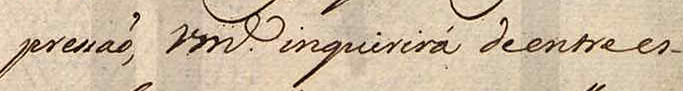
pressaõ, vm.e inquirirá de entre es
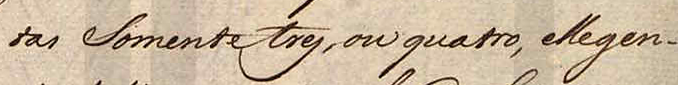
tas Somente tres, ou quatro, ellegen
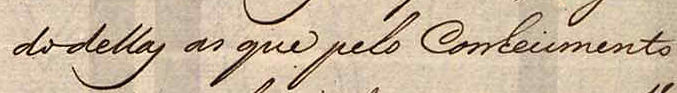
do dellas as que pelo Conhecimento
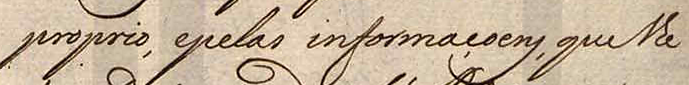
proprio, e pelas informaçoens, que lhe
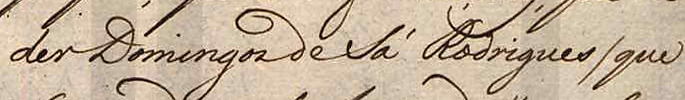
der Domingos de Sá Rodrigues /que
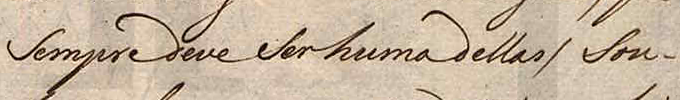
Sempre deve ser huma dellas/ Sou
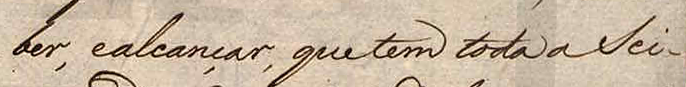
ber e alcançar que tem toda a Sci
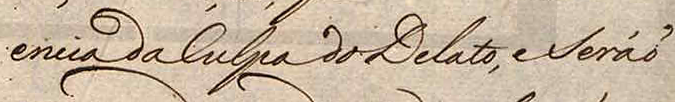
encia da Culpa do Delato, e Seraõ
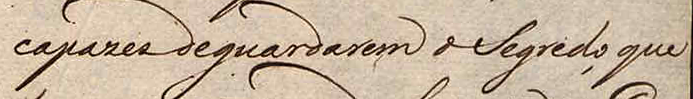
capazes de guardarem o Segredo, que
